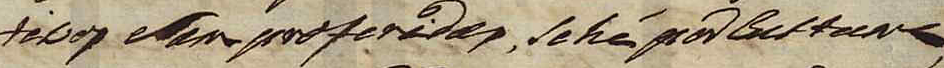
tivos sam proferidas, se hé por Custume,
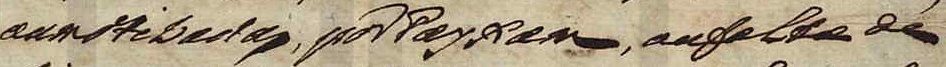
ou motivadas, por Payxam, ou falta de
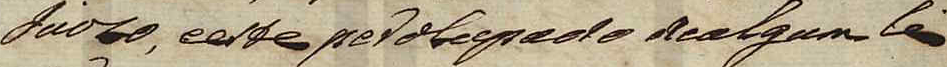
Juizo, e este perocupado de algum li
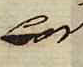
cor
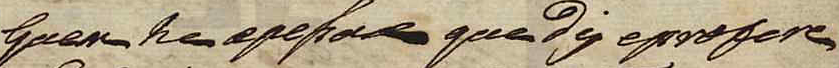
Quem he a pessoa que dis e profere
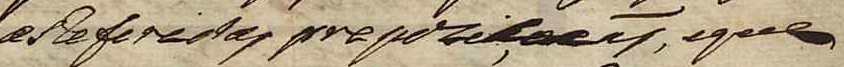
as Referidas prepoziçoens, e que
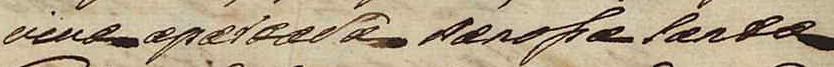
viva apartada da nossa santa
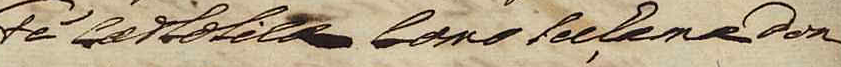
Fé Catholica como se çhama don
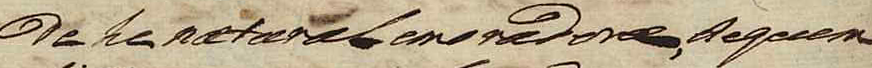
de he natural e moradora, de quem
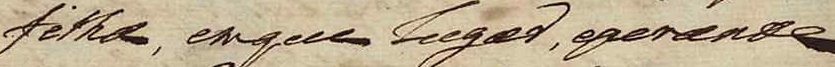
filha, em que Lugar, e perante
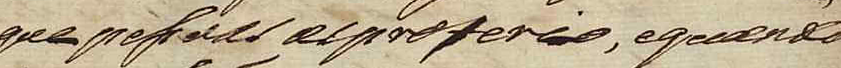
que pessoas as proferio, e quanto
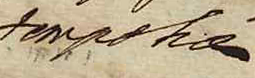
tempo há
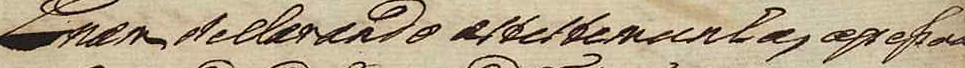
E nam declarando as testemunhas a pessoa
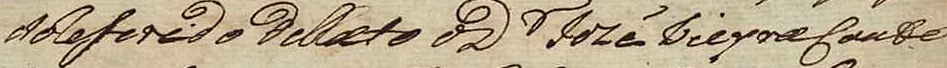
do Referido Delato o Dr Iozé Vieyra Couto
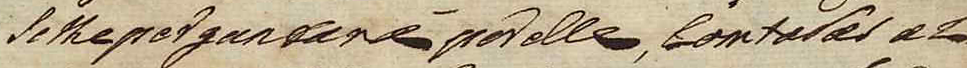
se lhe perguntará por elle, com todos as
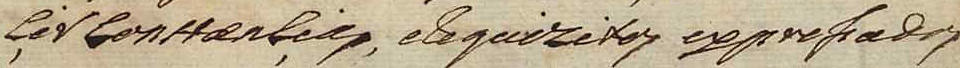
çirconstançias, e Requizitos expressados
